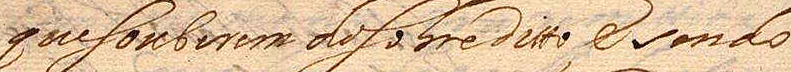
que souberem do sobreditto, E sendo
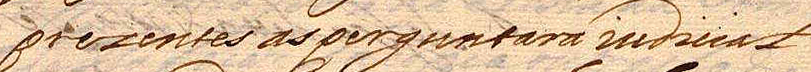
prezentes as perguntara iudiciaL
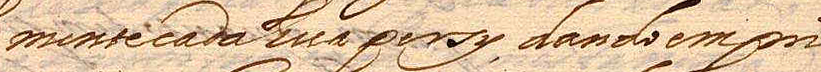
mente cada hua per sy, dando em pri
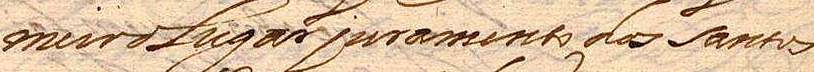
meiro Lugar juramento dos santos
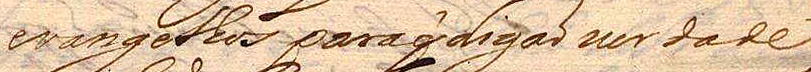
evangelhos para q̄ digaõ uerdade
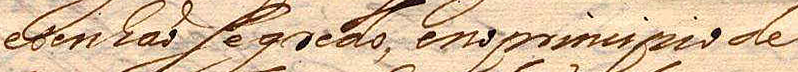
e tenhaõ segredo, e no principio de
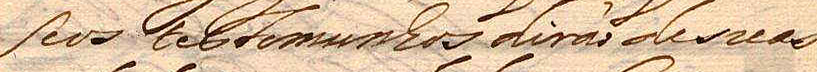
seus testemunhos diraõ de suas
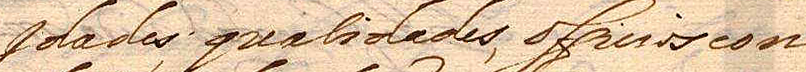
Jdades, qualidades, officios con
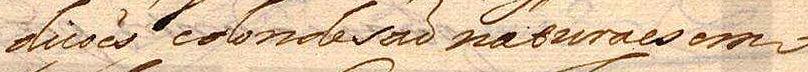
dições e donde são naturaes e mo
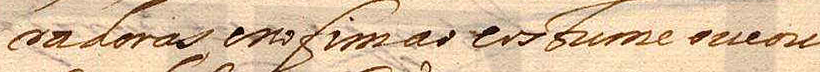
radoras, e no fim ao costume ou cou
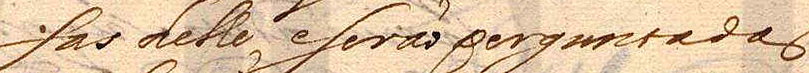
sas delle, e seraõ perguntadas
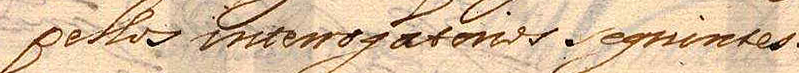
pellos interrogatorios seguintes.
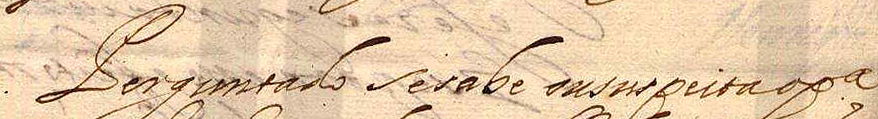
1. Perguntado se sabe ou suspeita o p.a
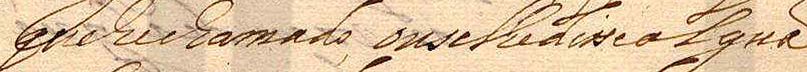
que he chamado, ou se lhe disse aLguā
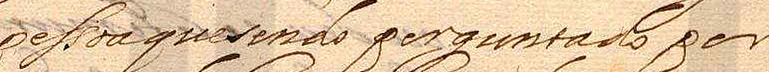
pessoa que sendo perguntado por
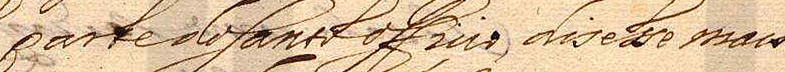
parte do Santo officçio, disesse mais
